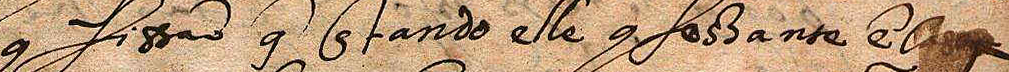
ꝯfissão q̅ estando elle ꝯfessante e̅ _
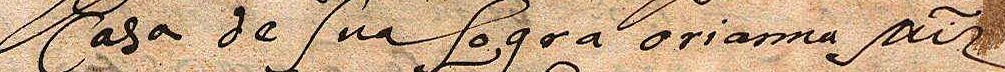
Casa de sua sogra orianna Mi̅z
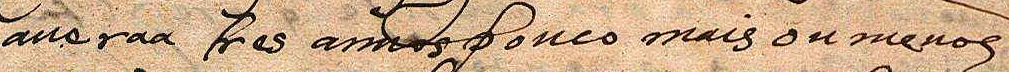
Aueraa tres annos pouco mais ou menos
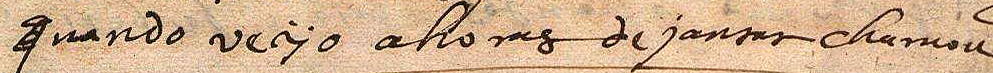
quando veyo a horas de jantar chamou
